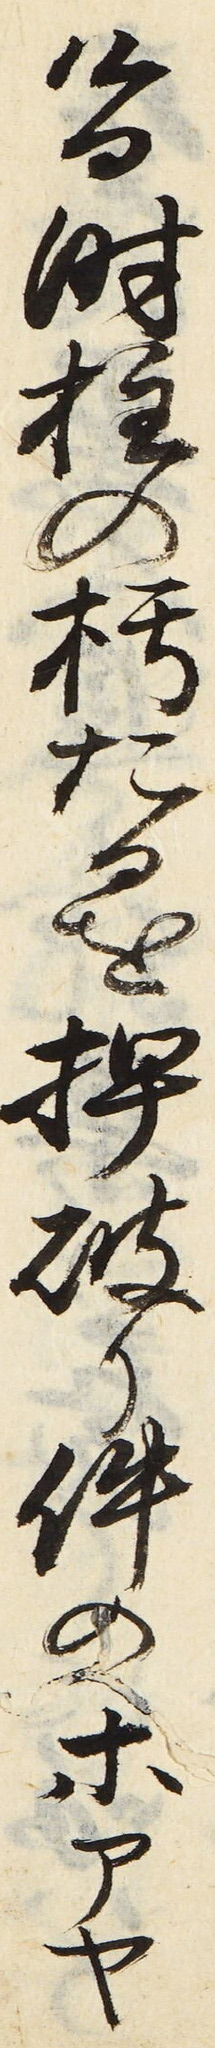ける時柱の朽たるを押破り件のホアヤ
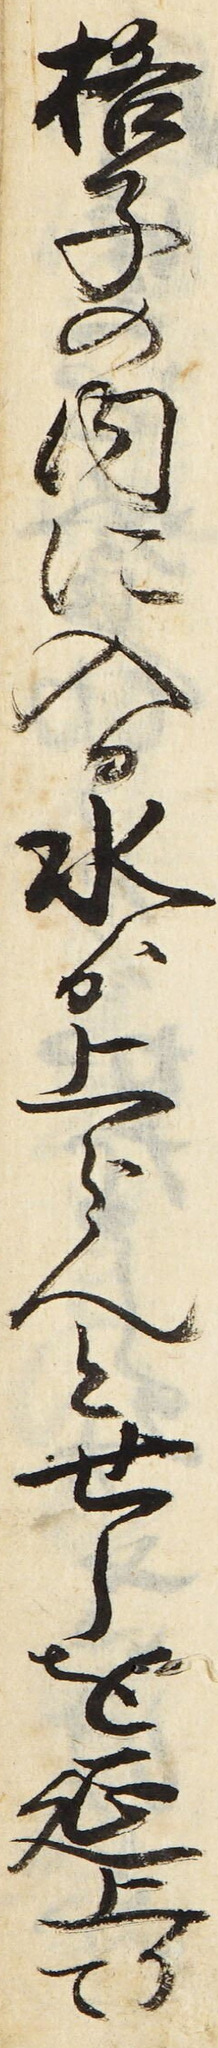格子の内に入る水ゟ上らんとせしを延上りて

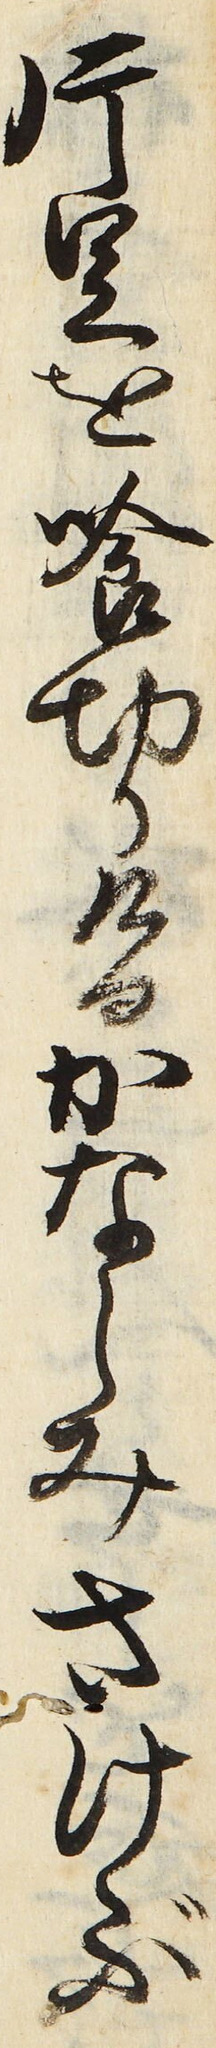片足を喰切りけるかなしみさけぶ
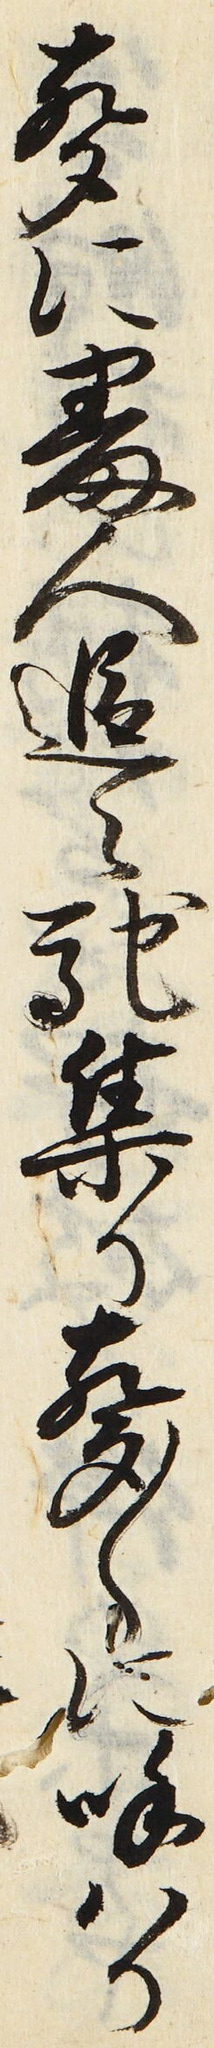声に番人追々馳集り声々に呼はり
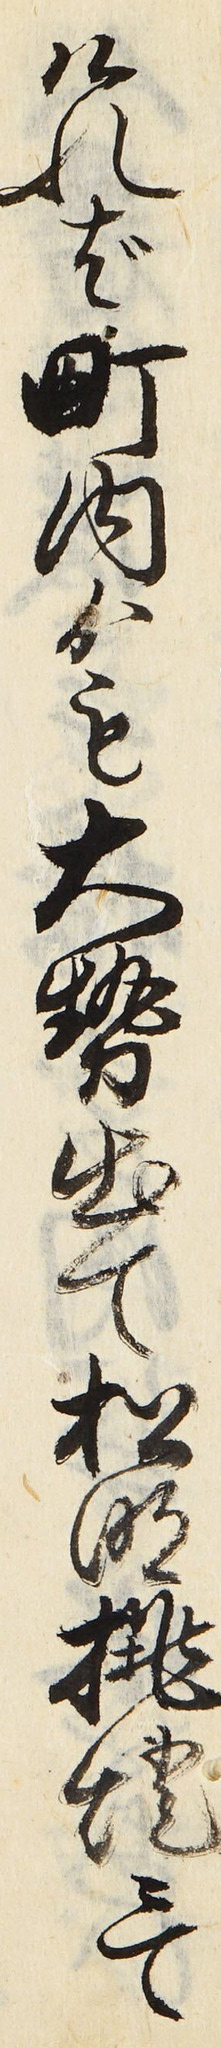けれど町内ゟも大勢出て松明挑燈にて
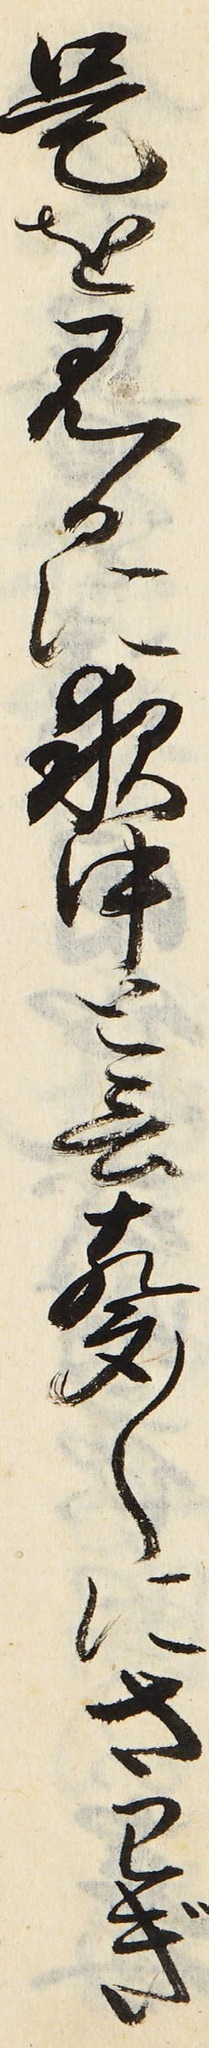是を見るに夜中と云声々にさわぎ
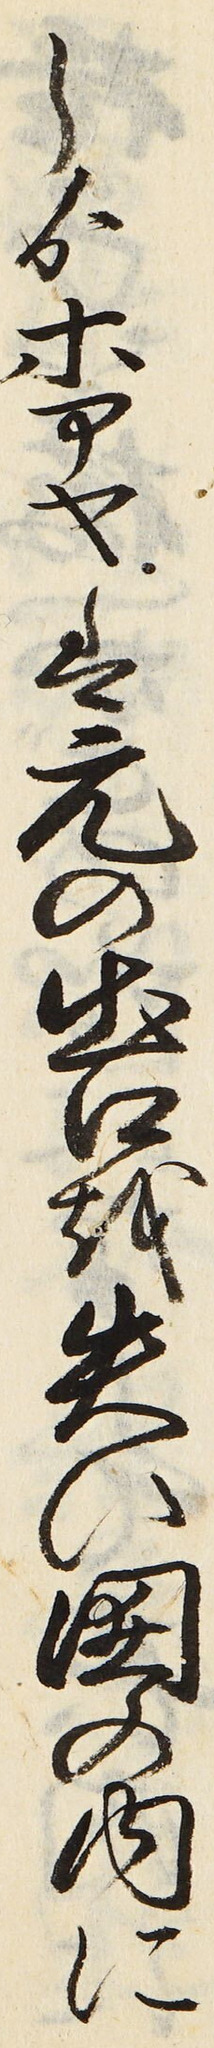しゟホアヤは元の出口を失ひ囲の内に
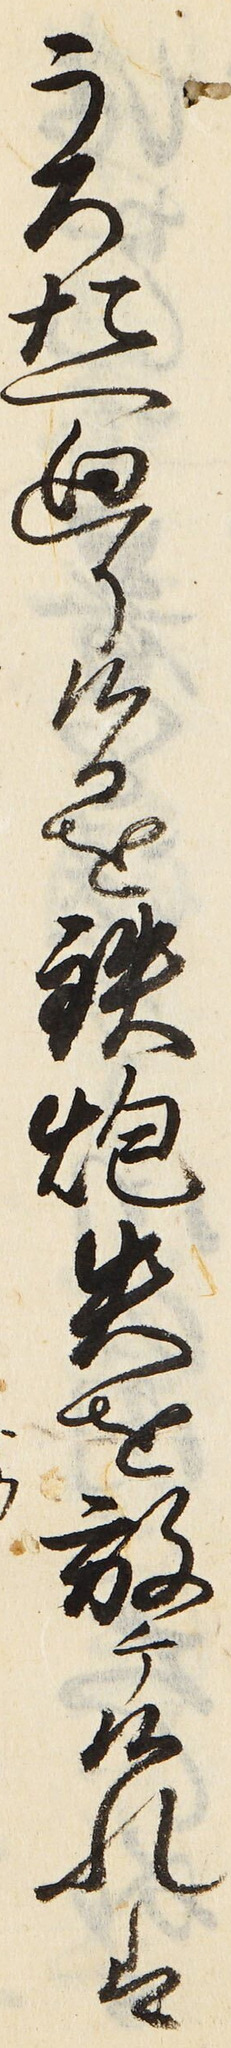うろたへ廻りけるを鉄砲矢を放ちければ
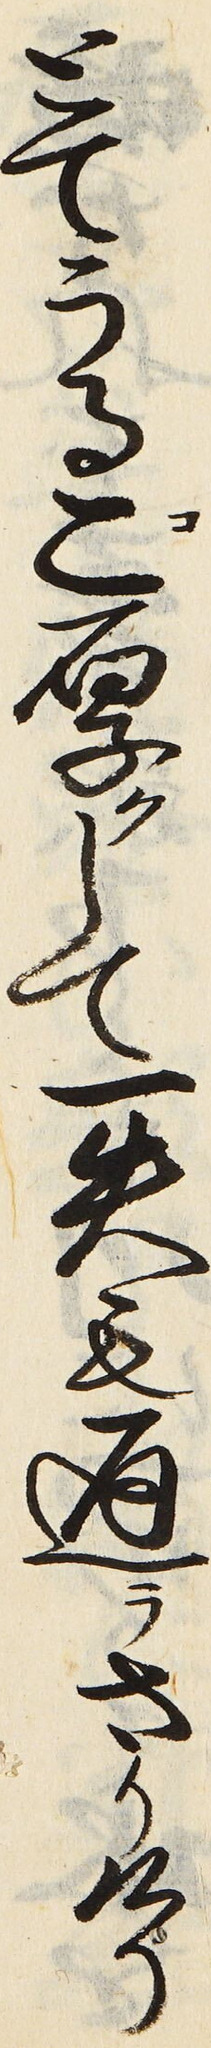とてうるこ厚くして一矢も通らさりけり
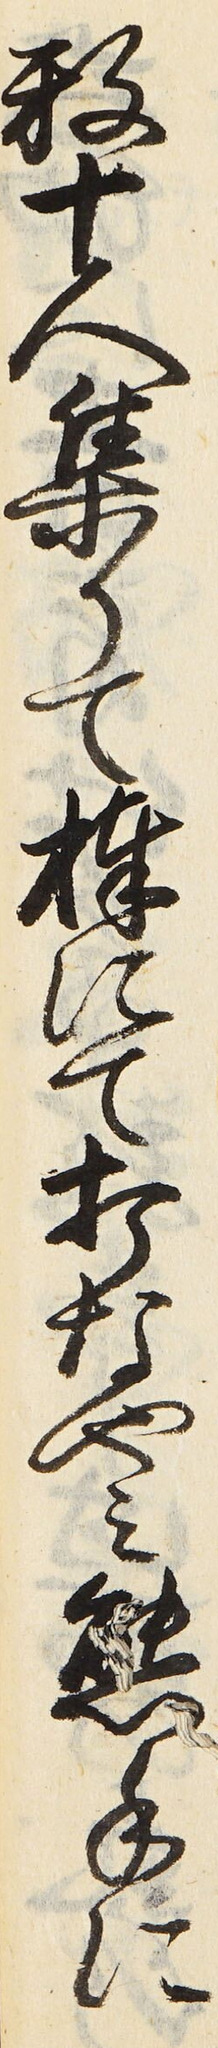数十人集りて棒にて打なやみ熊手に
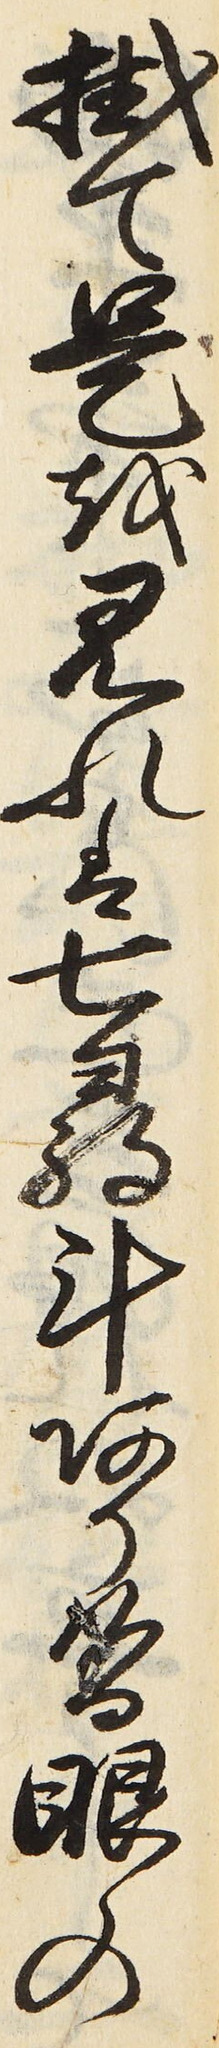掛て是を見れは七尋計ありける眼の
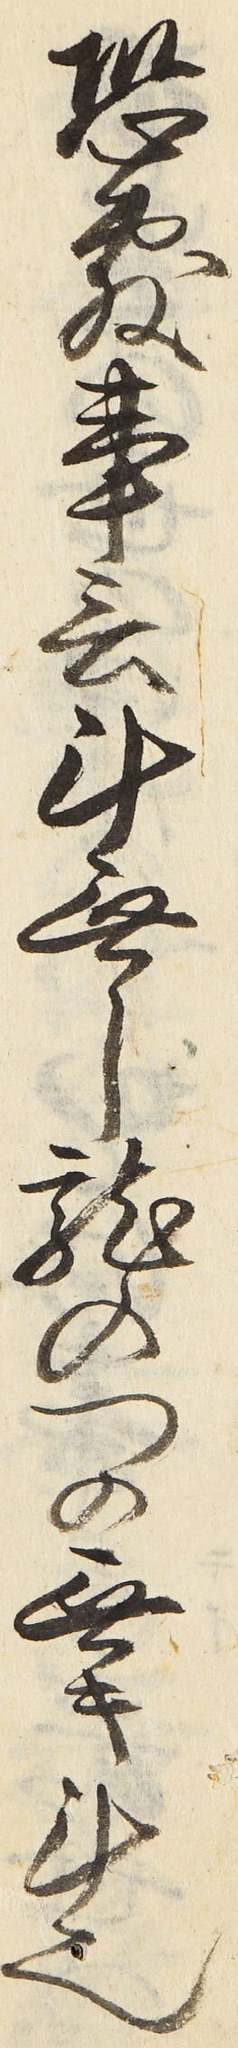恐敷事云計無し龍のつの無き計也
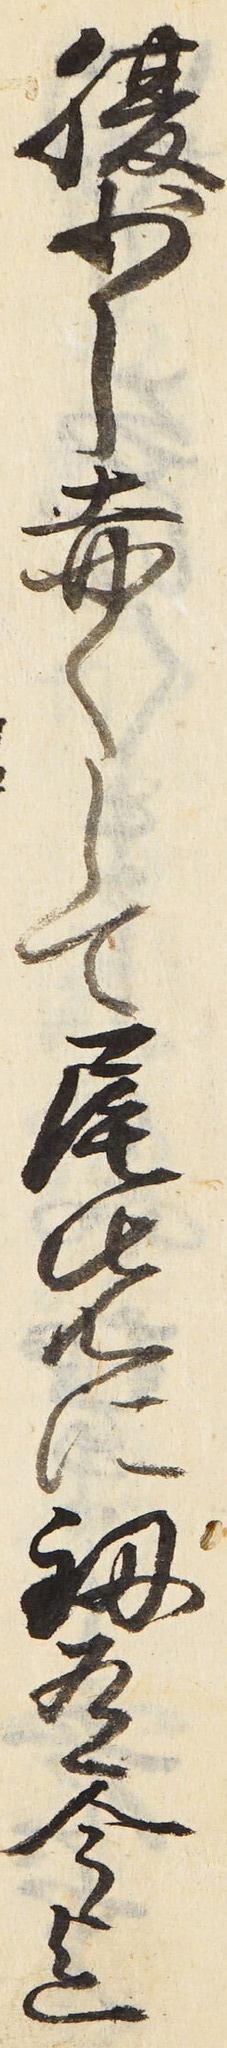腹少し赤くして尾先に釼有今迄
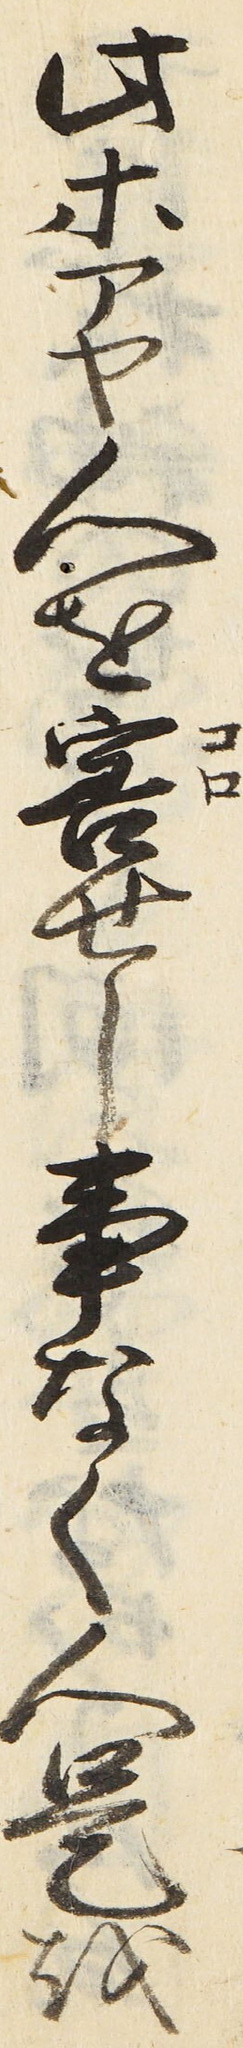此ホアヤ人を害せし事なく人是を
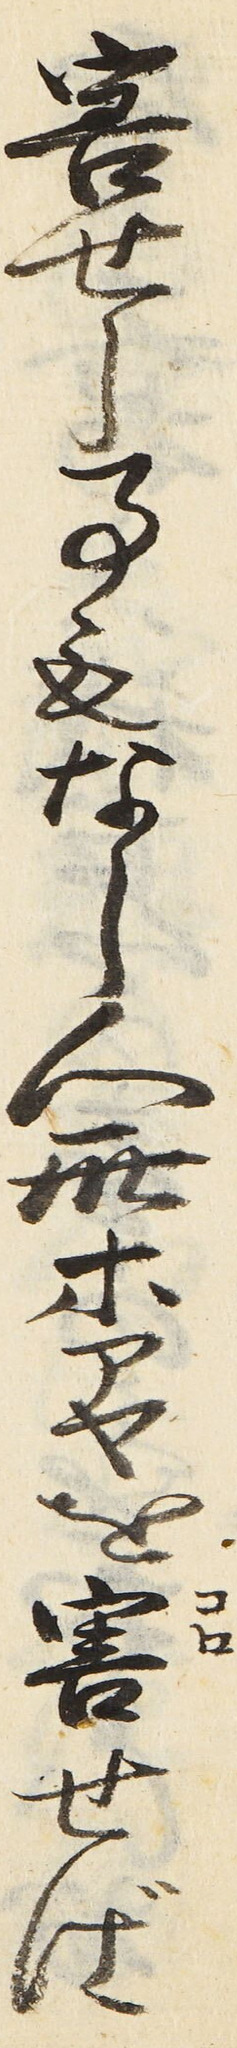害せし事もなし人此ホアヤを害せば
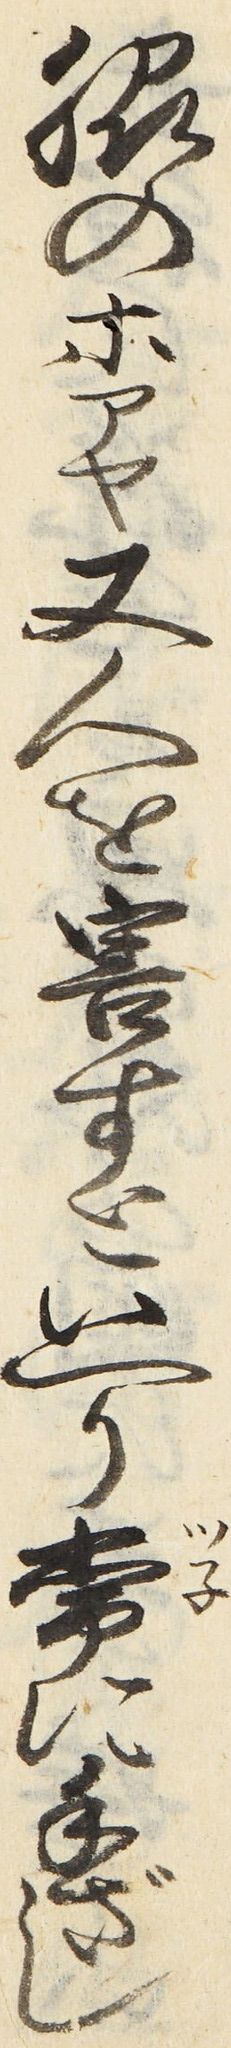脇のホアヤ又人を害すといへり常に手ざし
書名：華夷九年録
